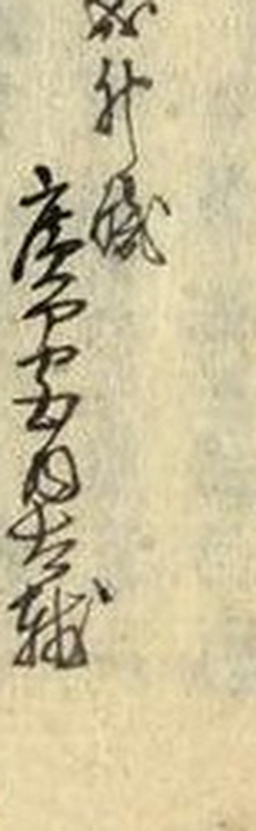広部宮内大輔
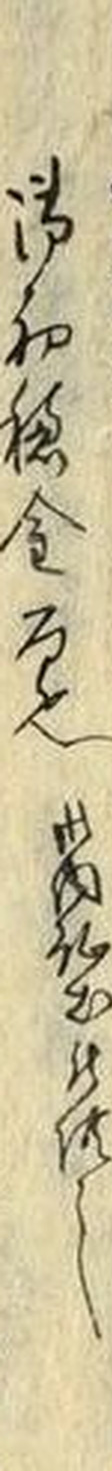御初穂金百疋御内証出被供之
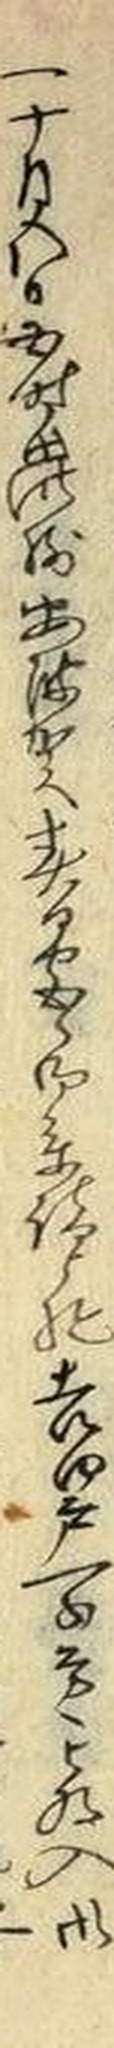一十月八日五時御供揃安波賀春日宮御参詣被遊吉田戸一郎方へ被為入御
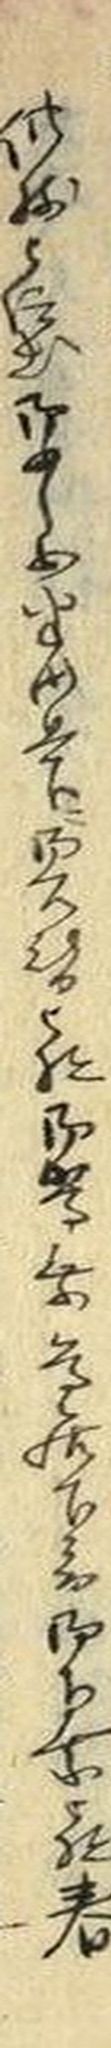供揃被仰出御のしめ半御上下御召替被遊御駕乗鳥居下ニ而御下乗被遊春
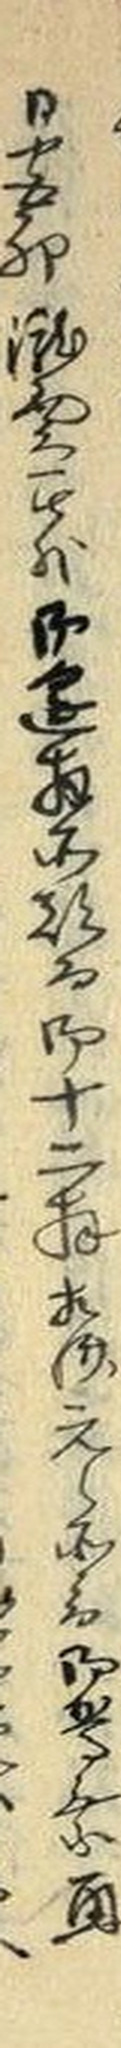日宮初瀧殿其外御遙拝所都而御十二拝相済元之所ニ而御駕乗再
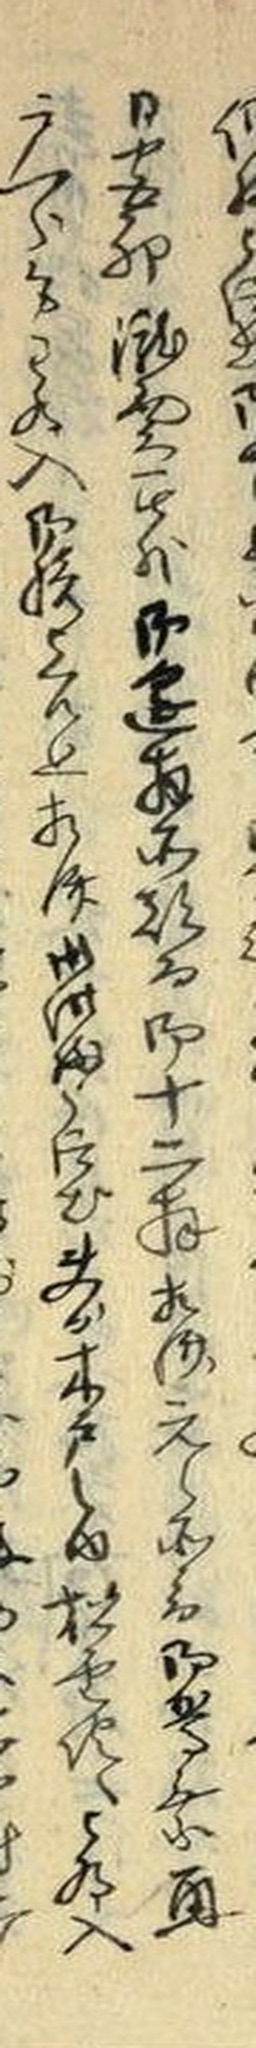戸一郎方へ被為入御膳被召上相済御供揃被仰出夫ゟ木戸之内松雲院へ被為入
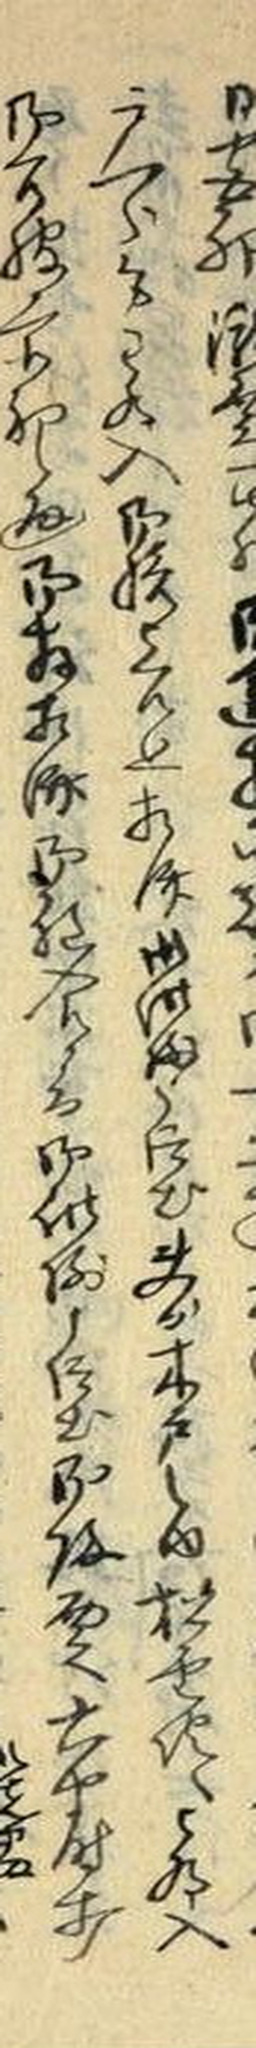御召服最初之通御拝相済御程合ニ而御供揃被仰出御帰殿六半時打
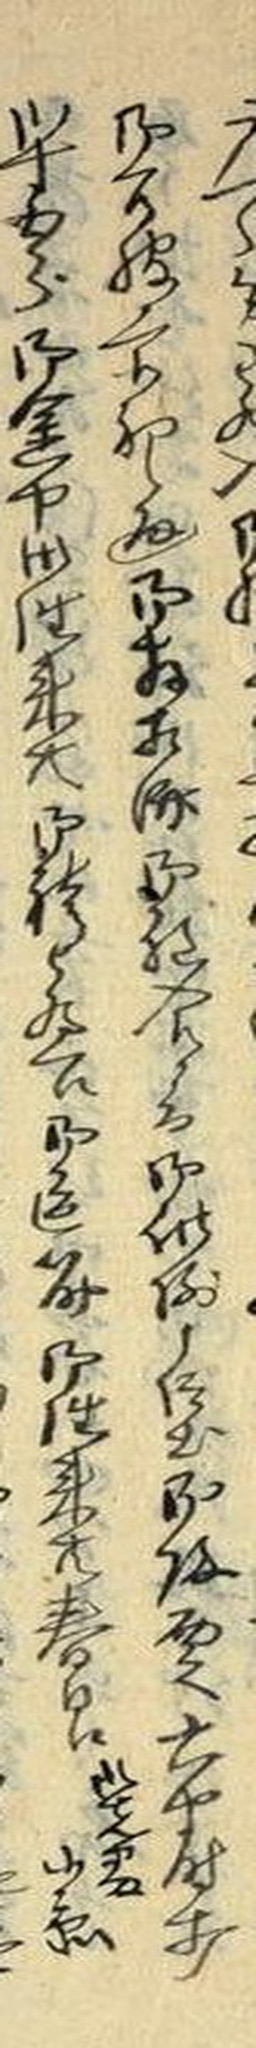弐寸五分御途中御往来共御袴被為召御道筋御往来共春日江御先番小兵衛
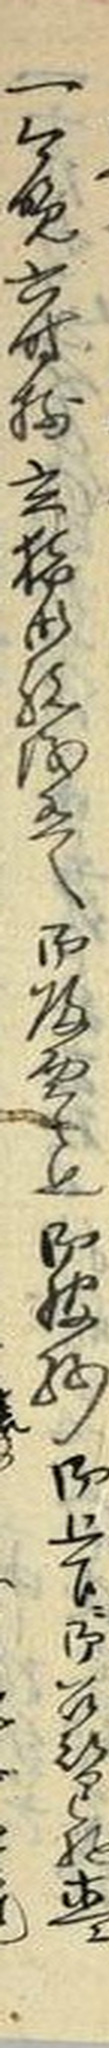一今晩六時揃玄猪御祝儀有之御帰殿之上御服紗御上下ニ御召替被遊直ニ
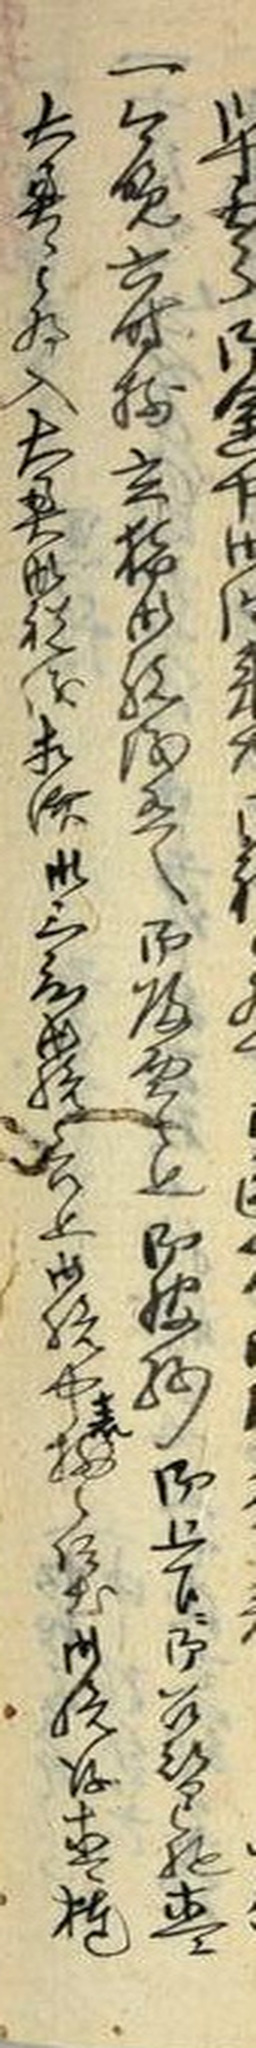大奥へ被為入大奥御祝儀相済御三度御膳被召上御膳中表揃被仰出御膳後直ニ韃
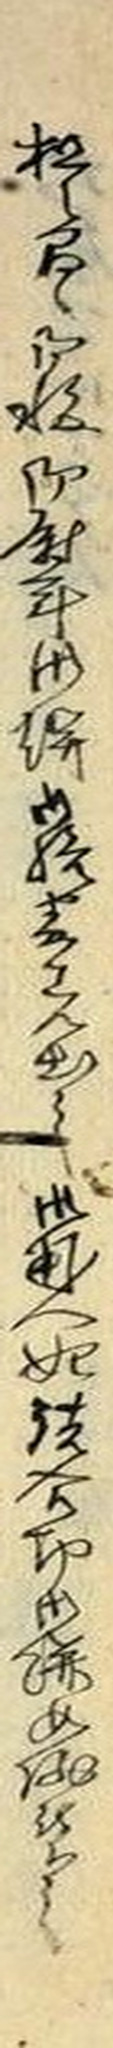靼之間へ御移御熨斗御餅御膳番差出之御用人始詰合切御餅如例被下之
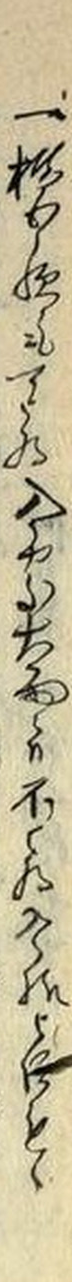一楷五郎様ニも可被為入候処大雨ニ付不被為入候様被仰進候
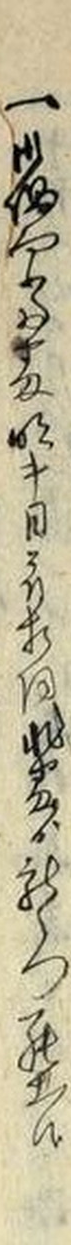一御側向当番明キ日ニ付相伺非番ゟ新右衛門罷出候
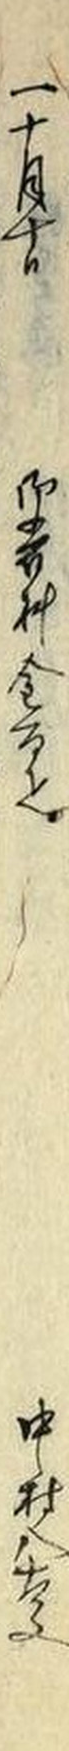一十月十日御肴料金百疋中村八太夫
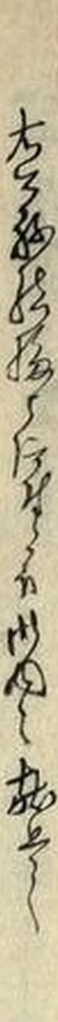右今般結構被仰付候二付御内々献上之
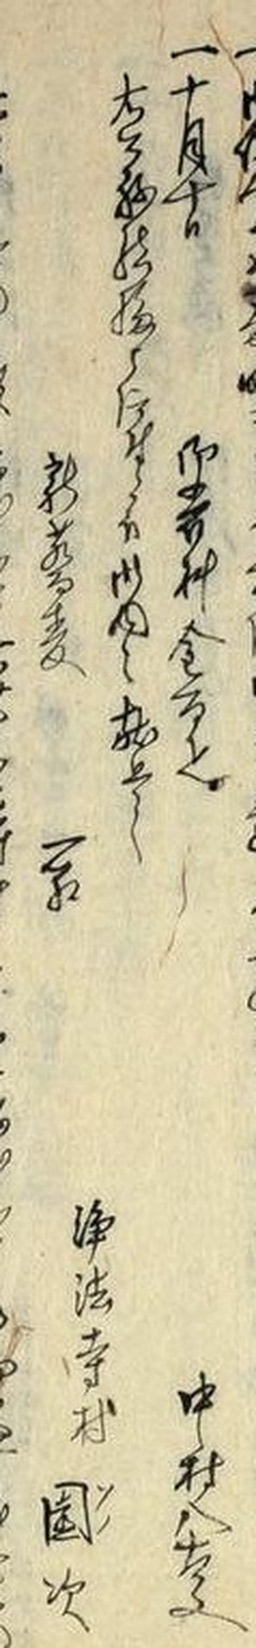右今般結構被仰付候二付御内々献上之
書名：少傅日録抄（斉承付側向頭取日記、在国）
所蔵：福井県文書館 Fukui Prefectural Archives
